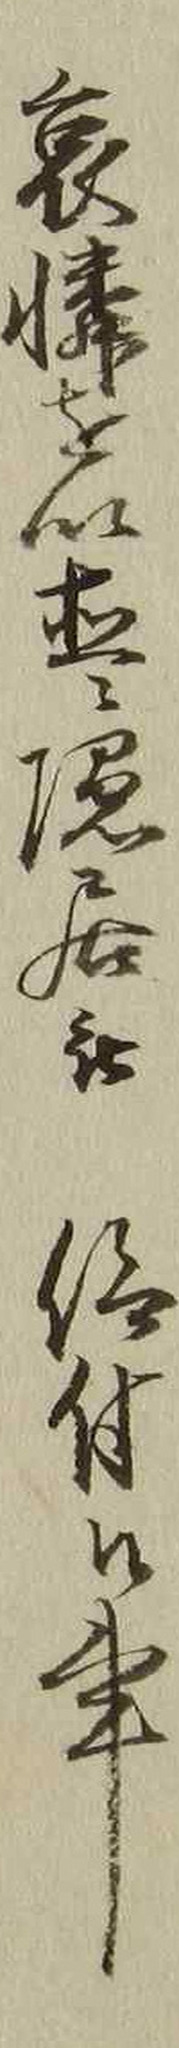哀憐を以直二隠居被仰付候事
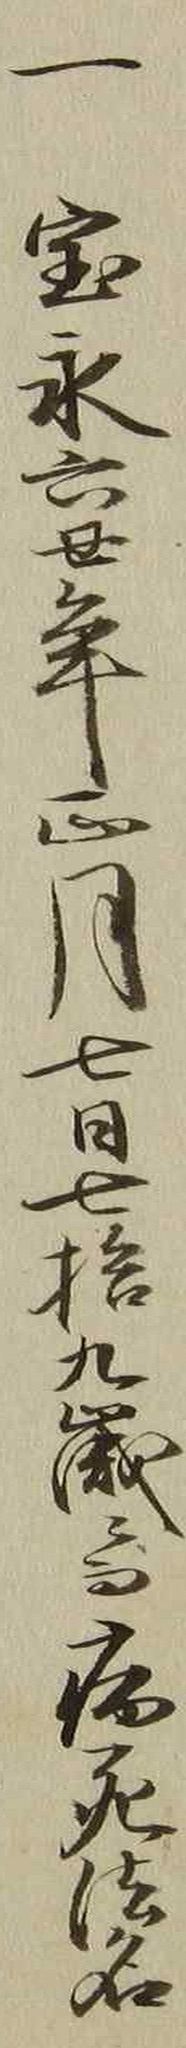一宝永六丑年正月七日七拾九歳ニ而病死法名
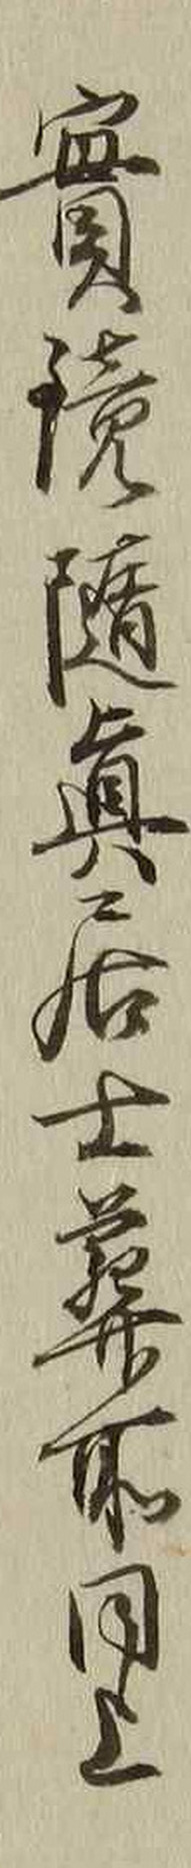実鏡随真居士葬所同上
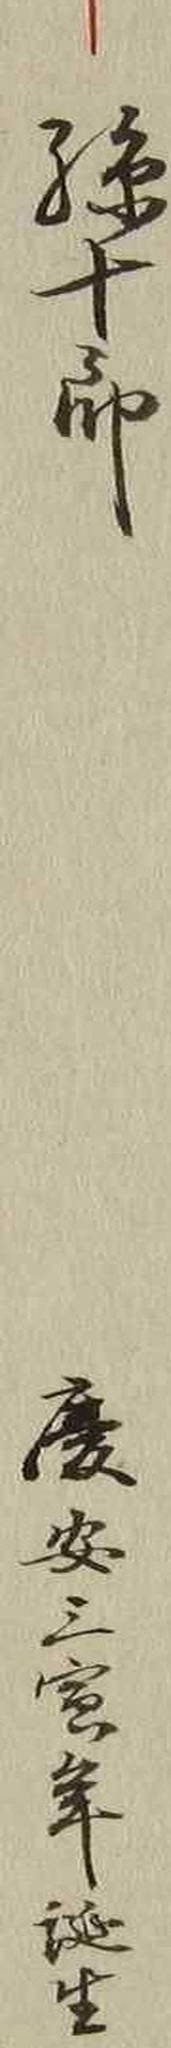孫十郎慶安三寅年誕生
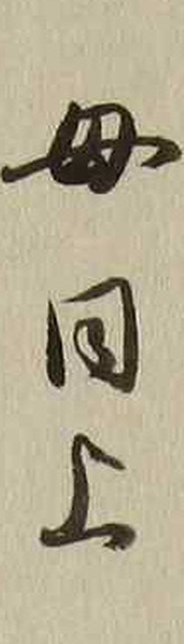母同上
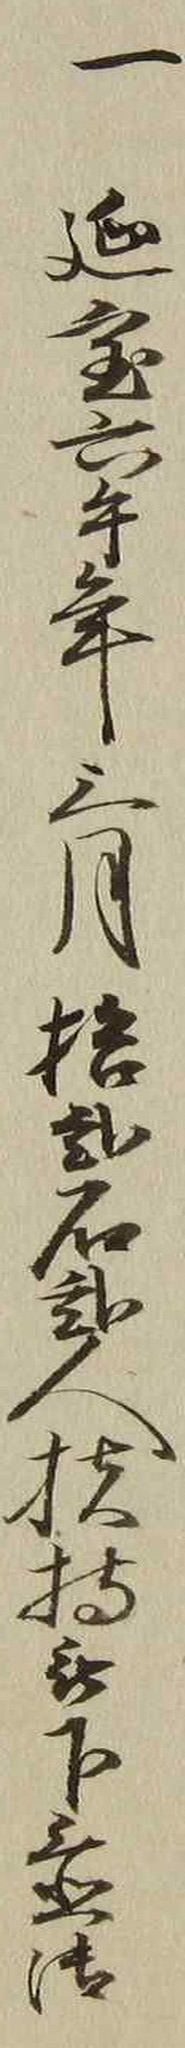一延宝六午年三月拾弐石弐人扶持被下置御
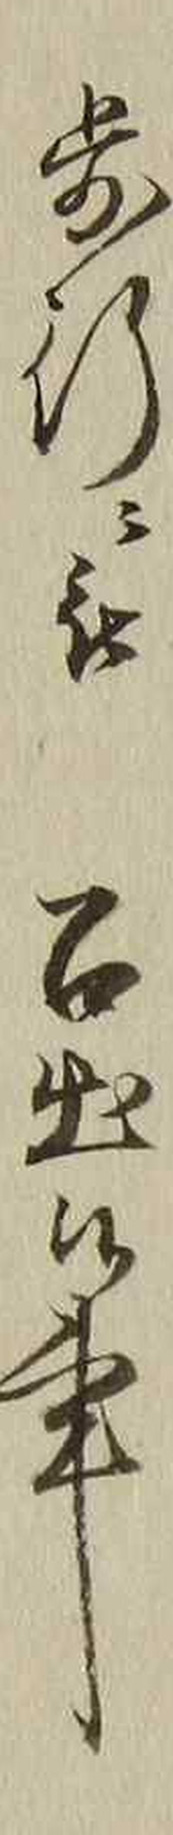歩行ニ被召出候事
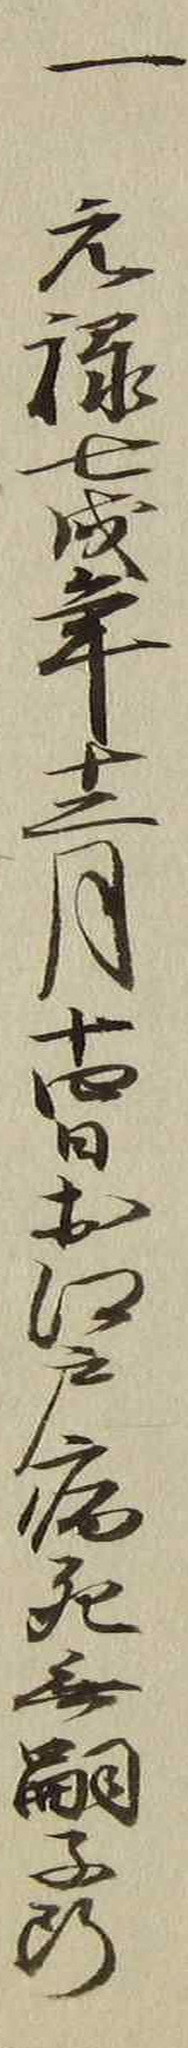一元禄七戌年十二月十四日お江戸病死無嗣子断
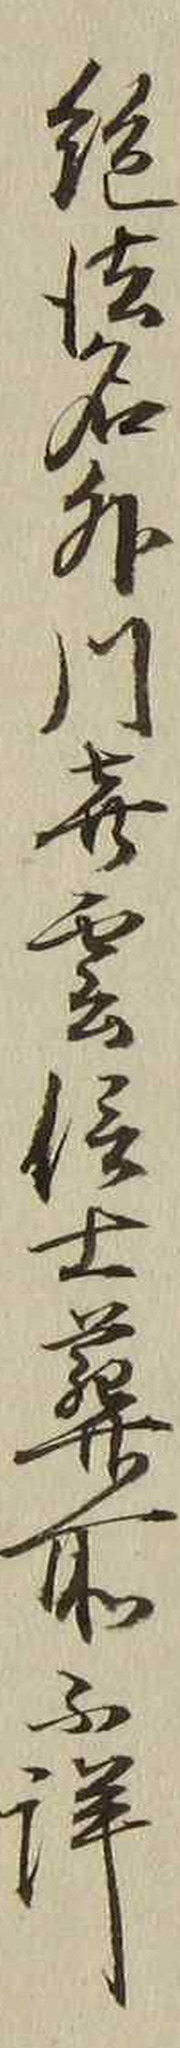絶法名外門喜雲信士葬所ふ詳
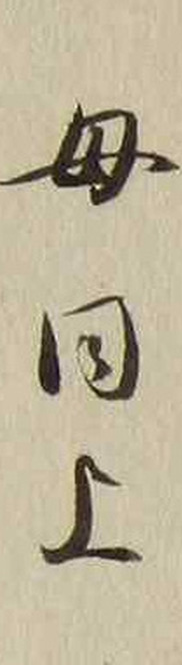母同上

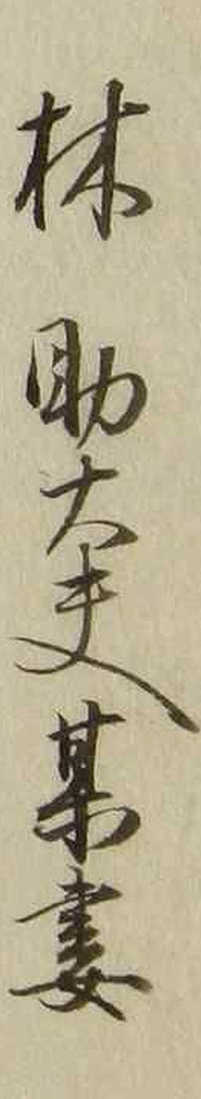女林助太夫某妻
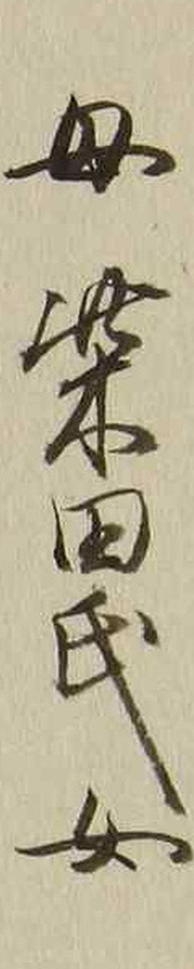母柴田氏女
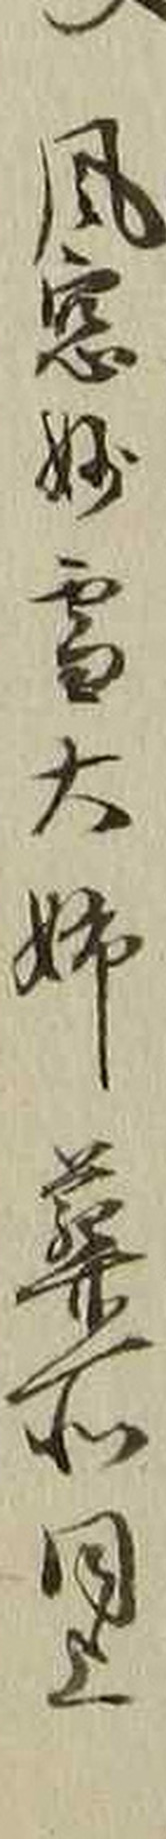風窓妙雪大姉葬所同上
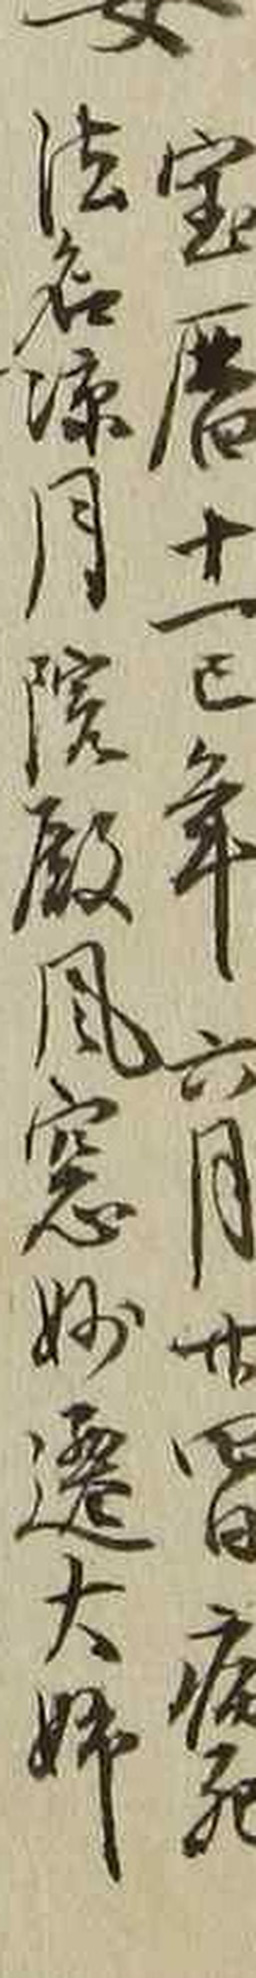法名涼月院殿風窓妙大姉
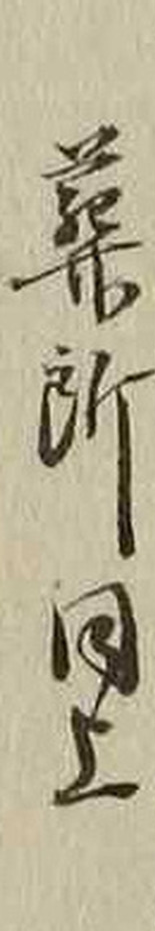葬所同上
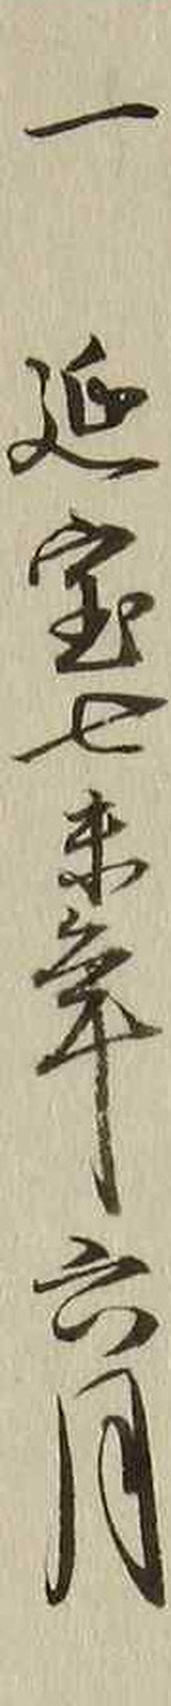一延宝七未年六月
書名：諸士系譜　巻之114　か之部22
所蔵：会津若松市立会津図書館
